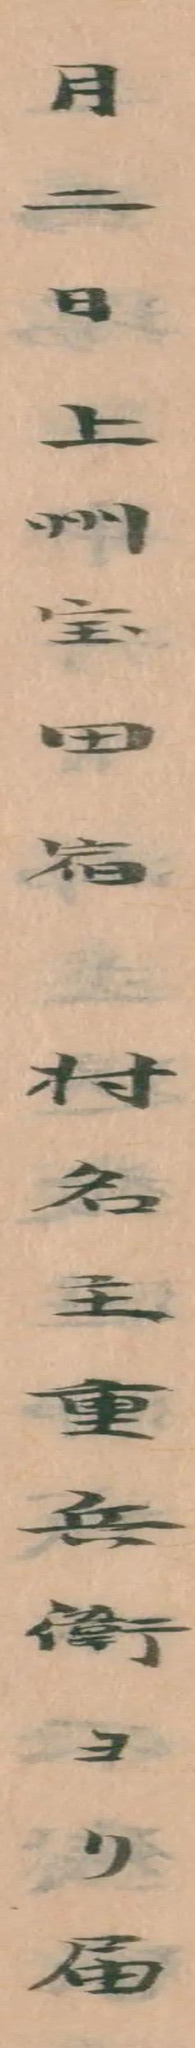四月二日上州宝田宿村名主重兵衛ヨリ届
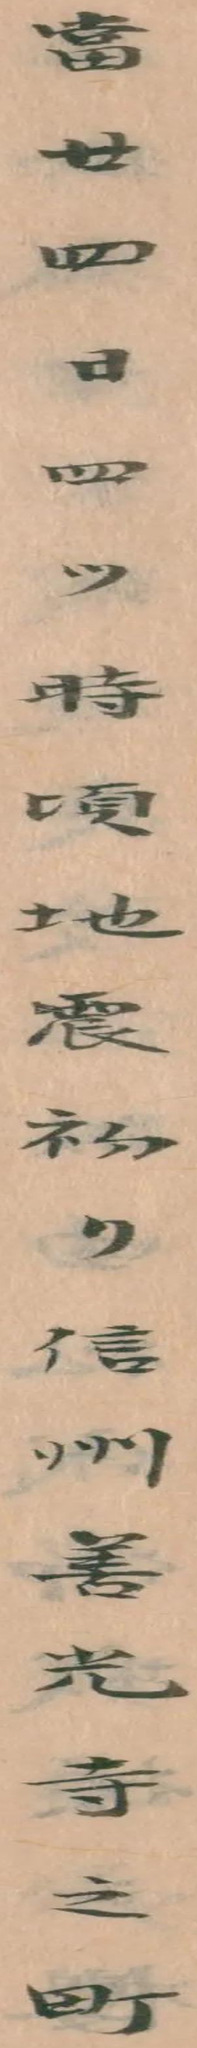当廿四日四ッ時頃地震初り信州善光寺之町
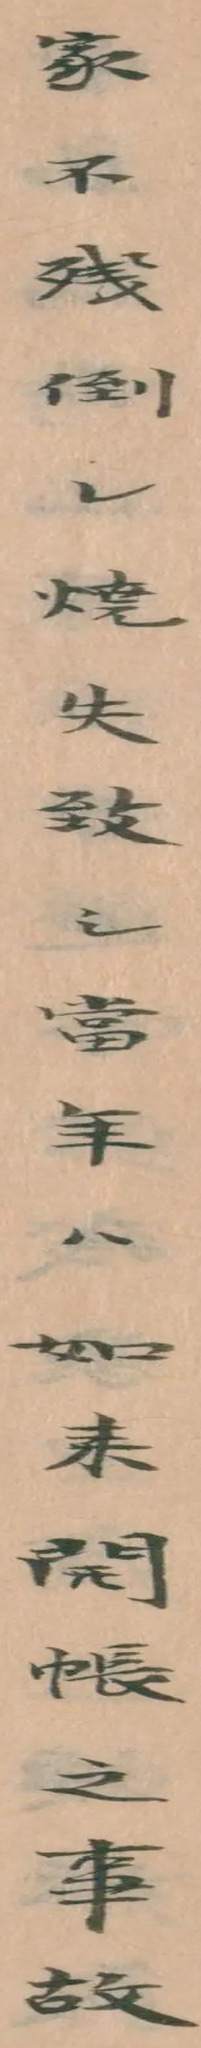家不残倒レ焼失致シ当年ハ如来開帳之事故
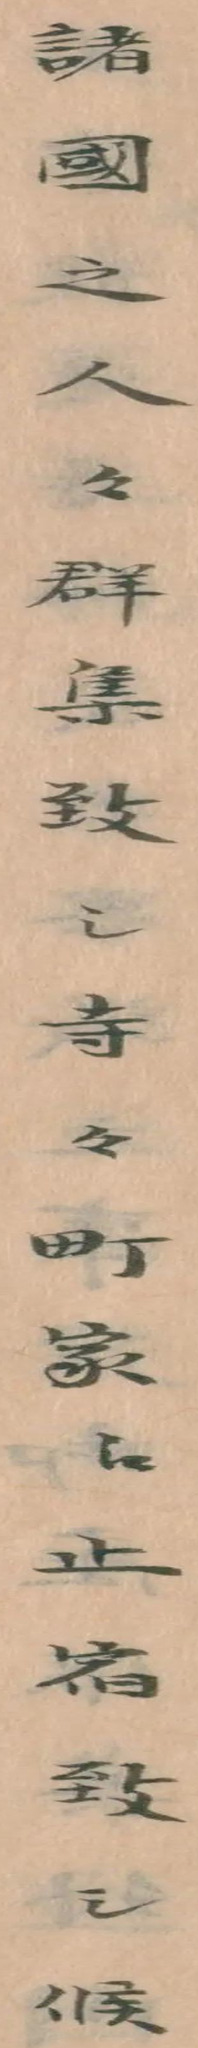諸国之人々群集致シ寺々町家江止宿致シ候
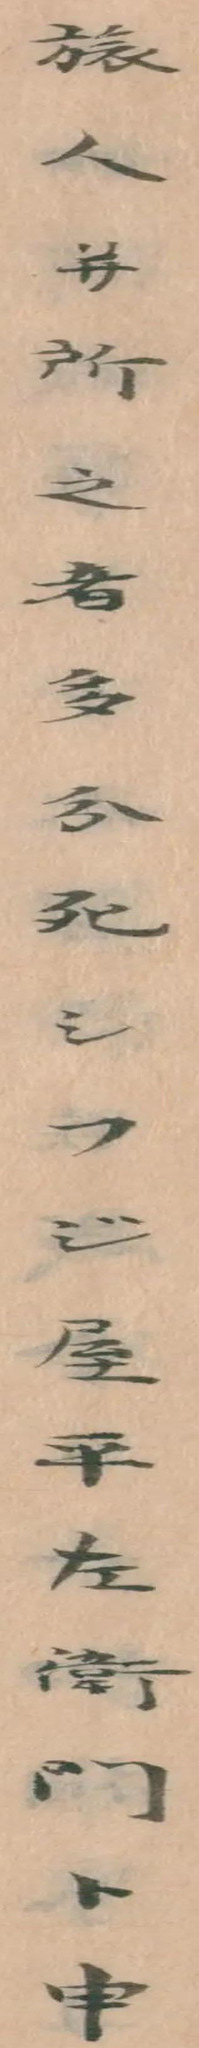旅人并所之者多分死シフジ屋平左衛門ト申
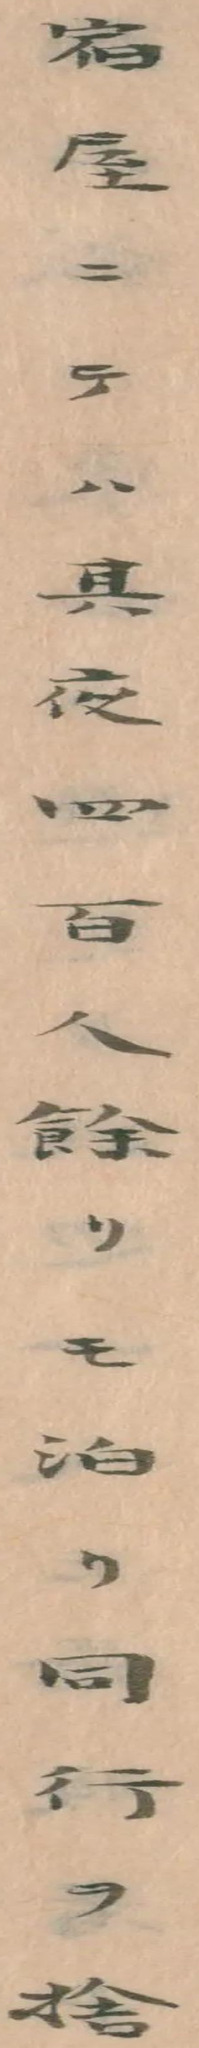宿屋二テハ其夜四百人余リモ泊り同行ヲ捨
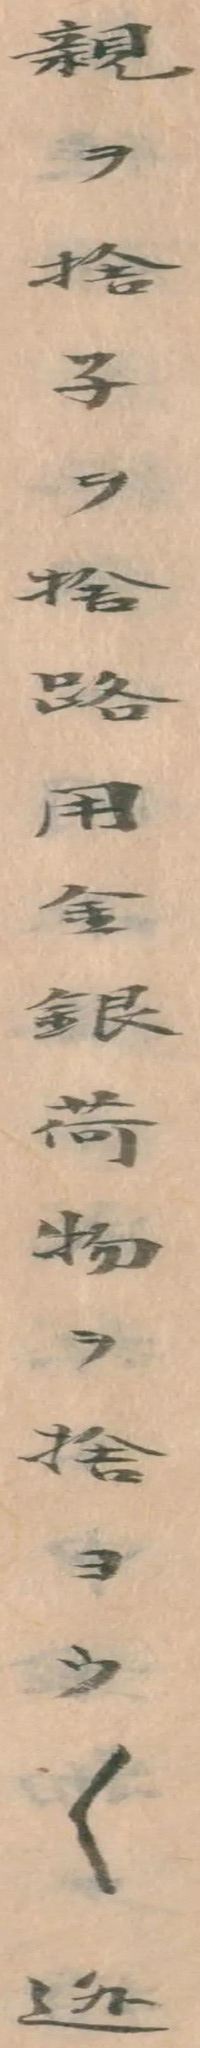親ヲ捨子ヲ捨路用金銀荷物ヲ捨ヨウ〳〵逃
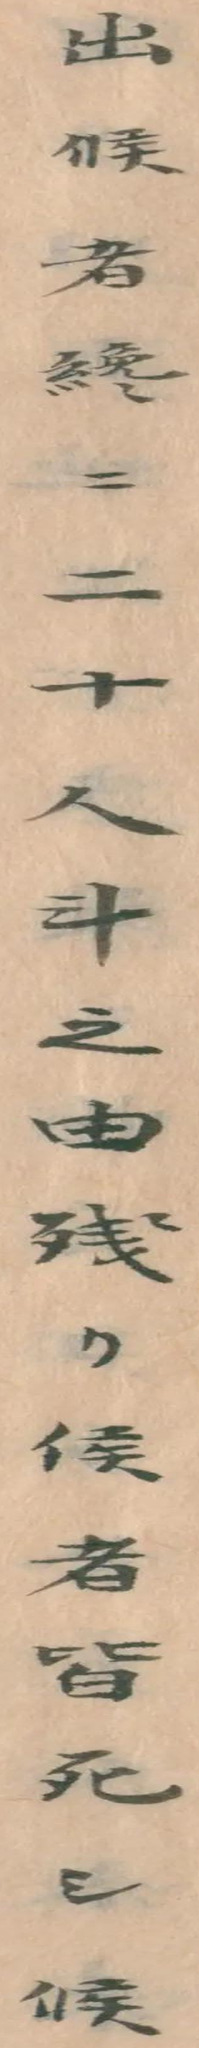出候者纔二二十人斗之由残り候者皆死シ候
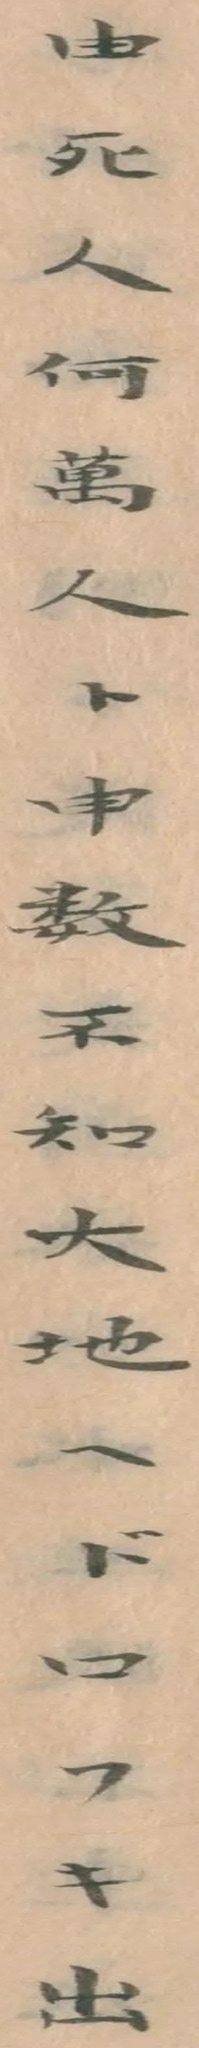由死人何万人ト申数不知大地へドロフキ出

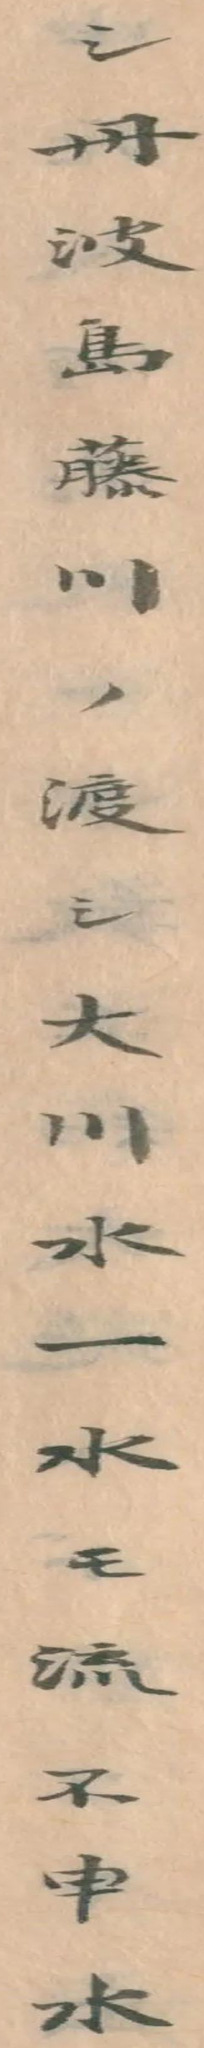シ丹波島藤川ノ渡シ大川水一水モ流不申水
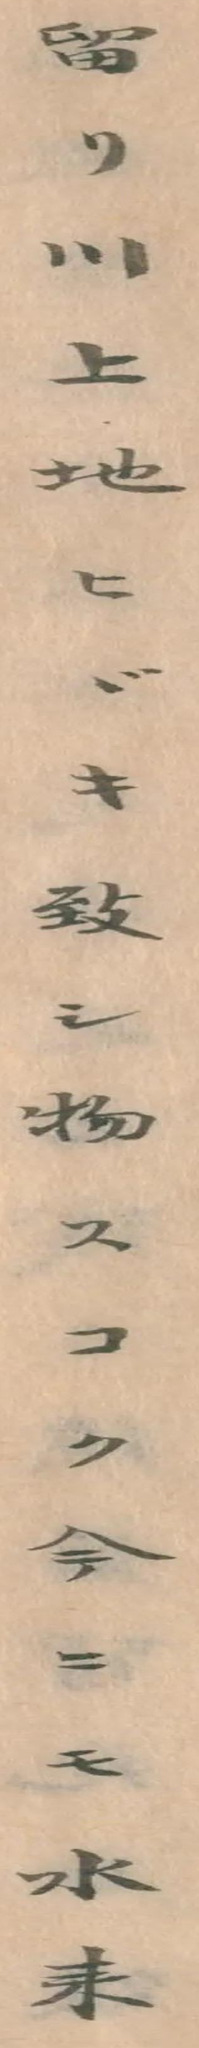留り川上地ヒゞキ致シ物スコク今二モ水来
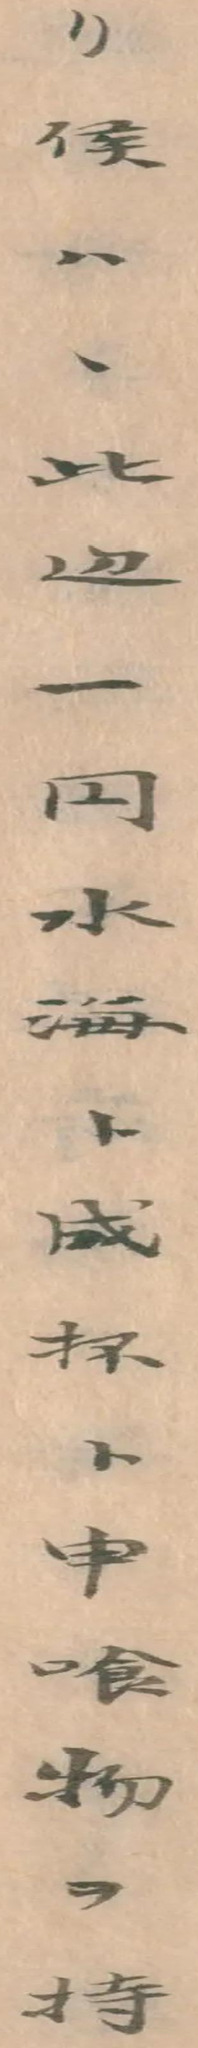り候ハゝ此辺一円水海ト成抔ト申喰物ヲ持
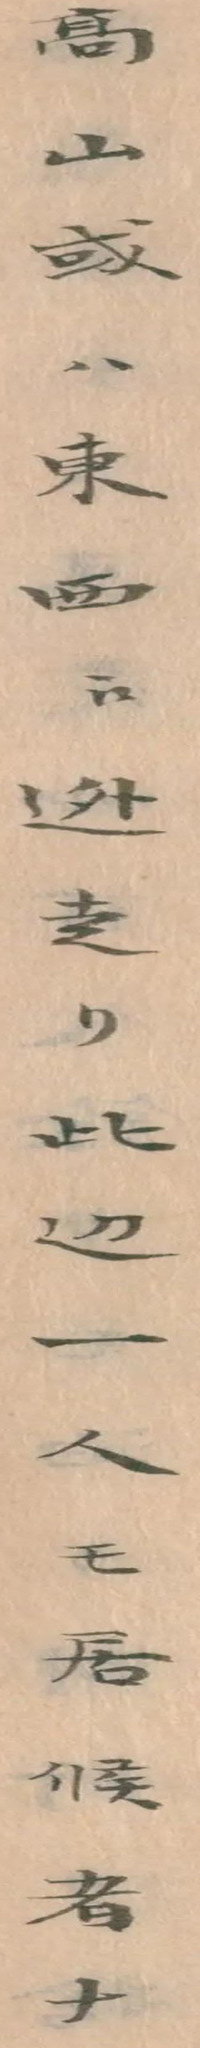高山或ハ東西江逃走り此辺一人モ居候者ナ
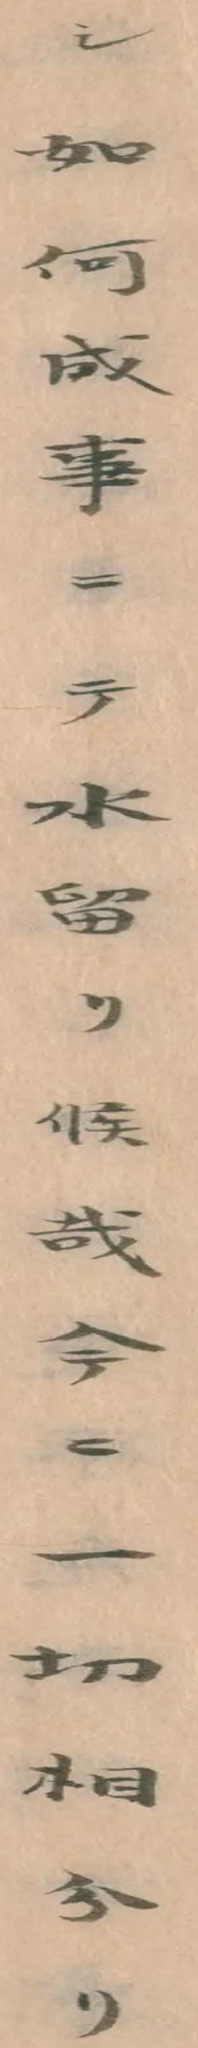シ如何成事二テ水留り候哉今二一切相分り
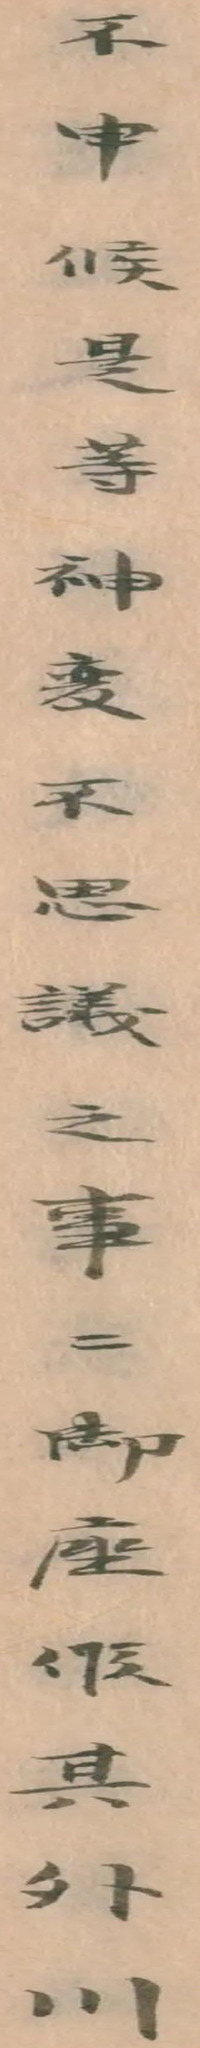不申候是等神変不思議之事二御座候其外川
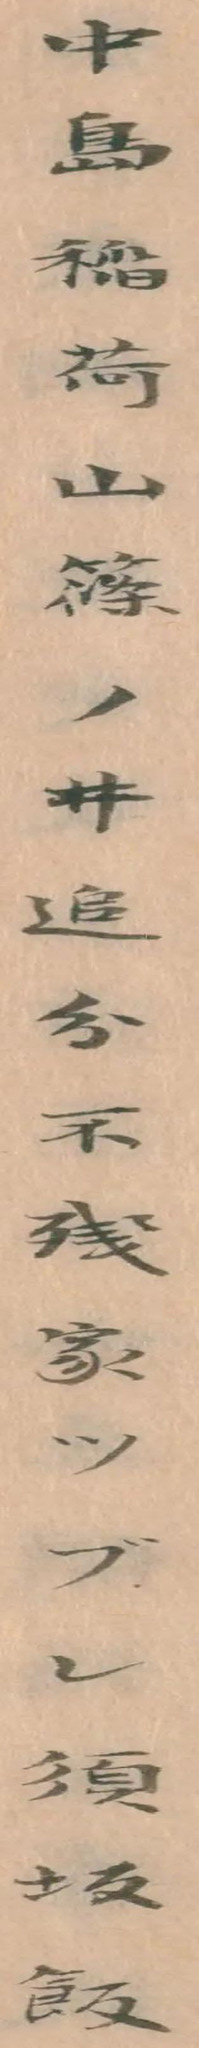中島稲荷山篠ノ井追分不残家ツブレ須坂飯
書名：地災撮要. 巻1(噴火山・地震ノ部)
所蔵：国立国会図書館 National Diet Library, JAPAN
